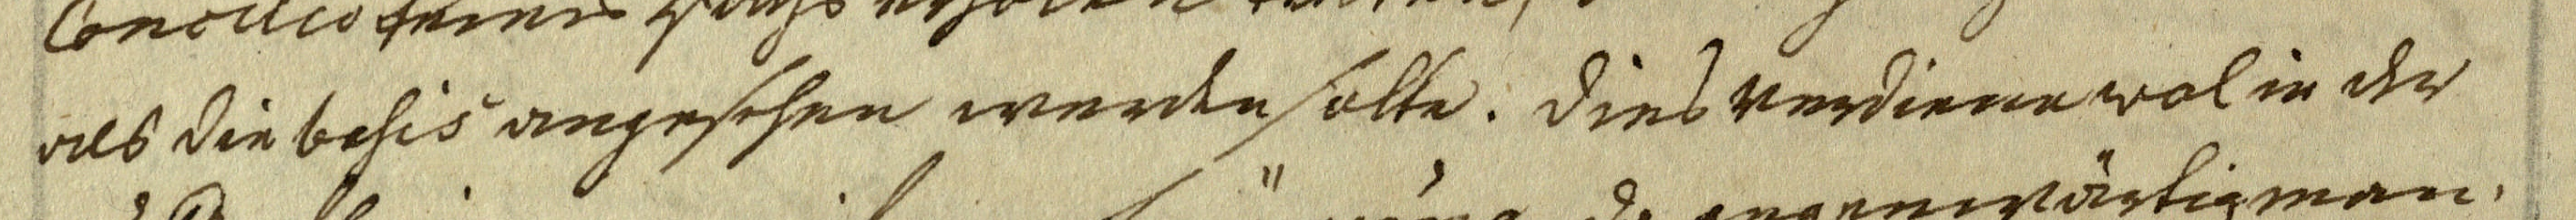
als die basis angesehen werden solte. Dies verdiene wohl in der
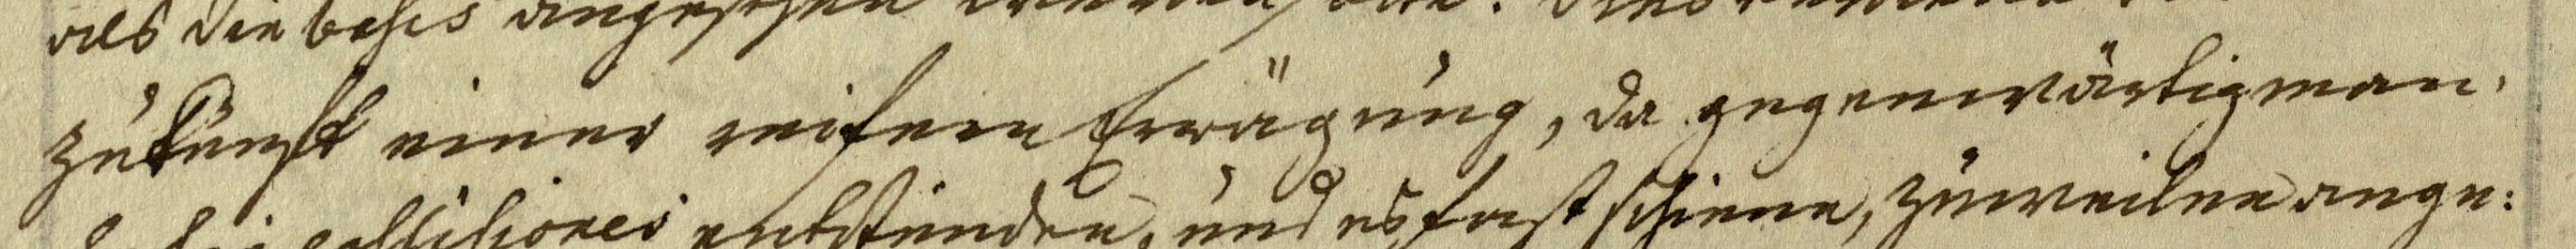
Zukunft einer reifern Erwägung, da gegenwärtig man¬
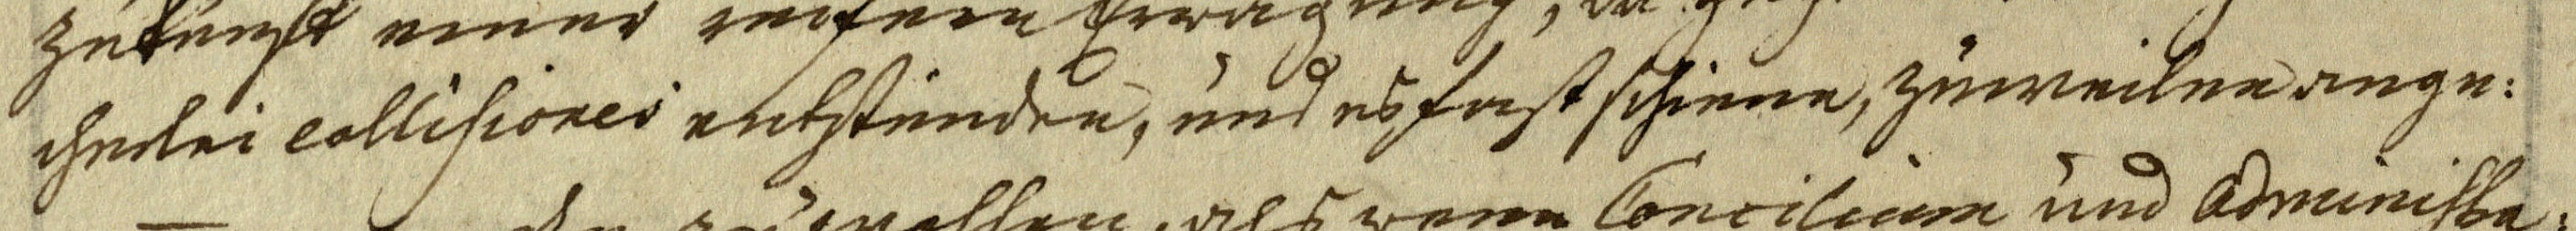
cherlei collisiones ebtstünden, und esfast schiene, zuweilen ange¬
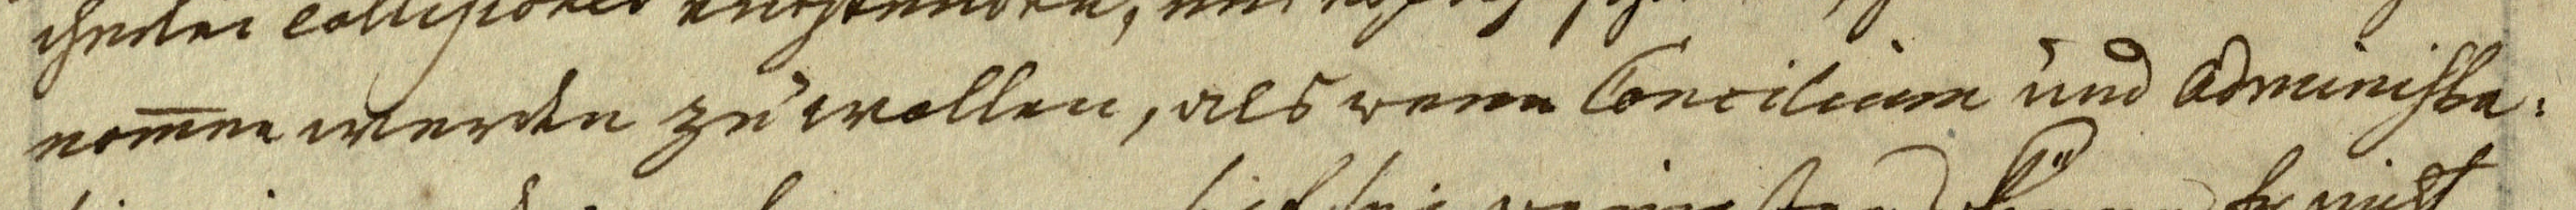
nomen werden zu wollen, als wenn Concilium und Administra¬
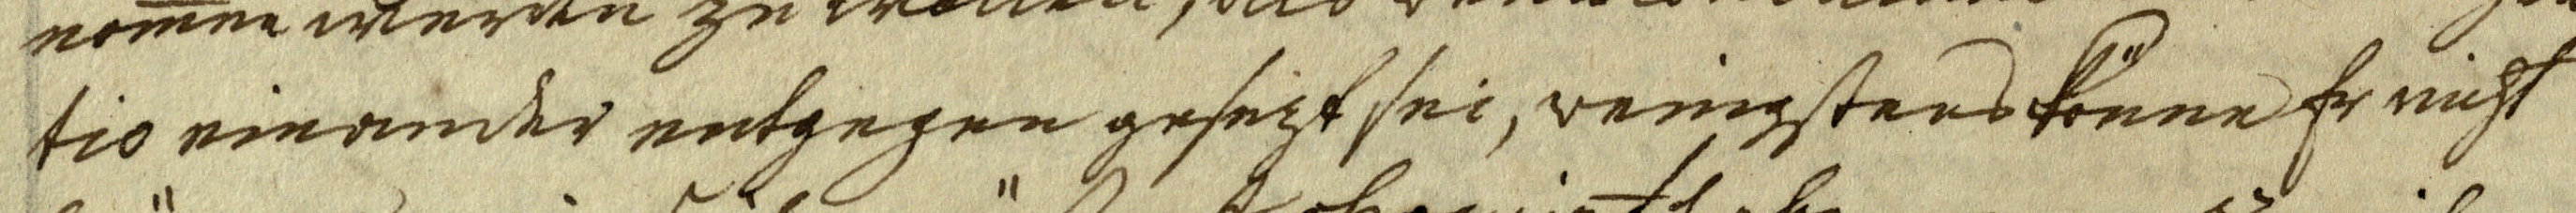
tio einander entgegen gesezt sei, wenigstens könne Er nicht
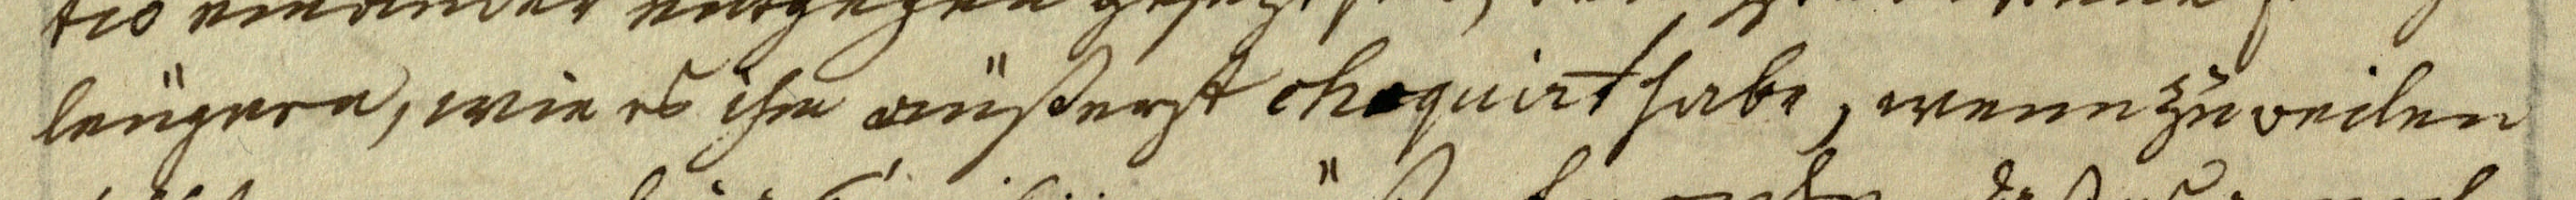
leugen, wie es ihm äußerst choquirt habe, wenn zu weilen
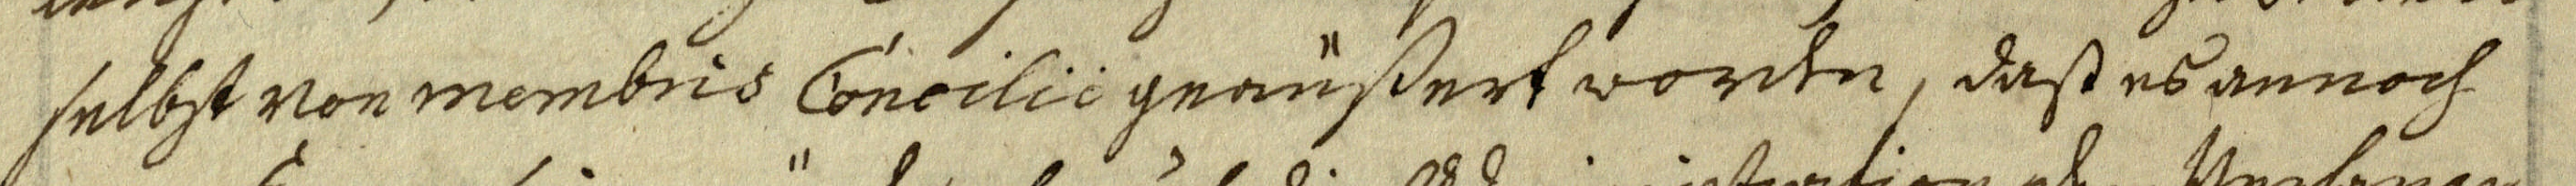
selbst von membris Concilii geäußert worden, daß es annoch
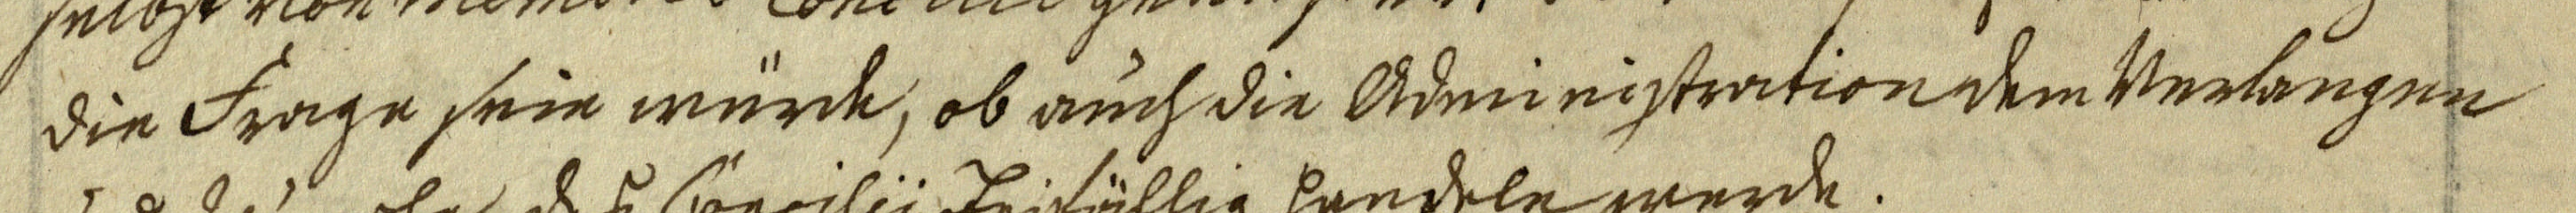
die Frage sein würde, ob auch die Administration dem Verlangen
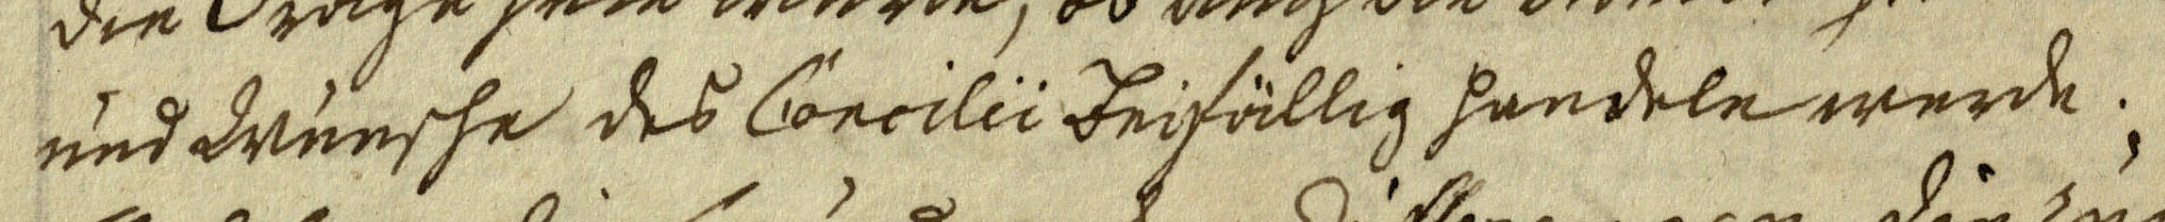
und Wunsche des Concilii beifällig handeln werde.
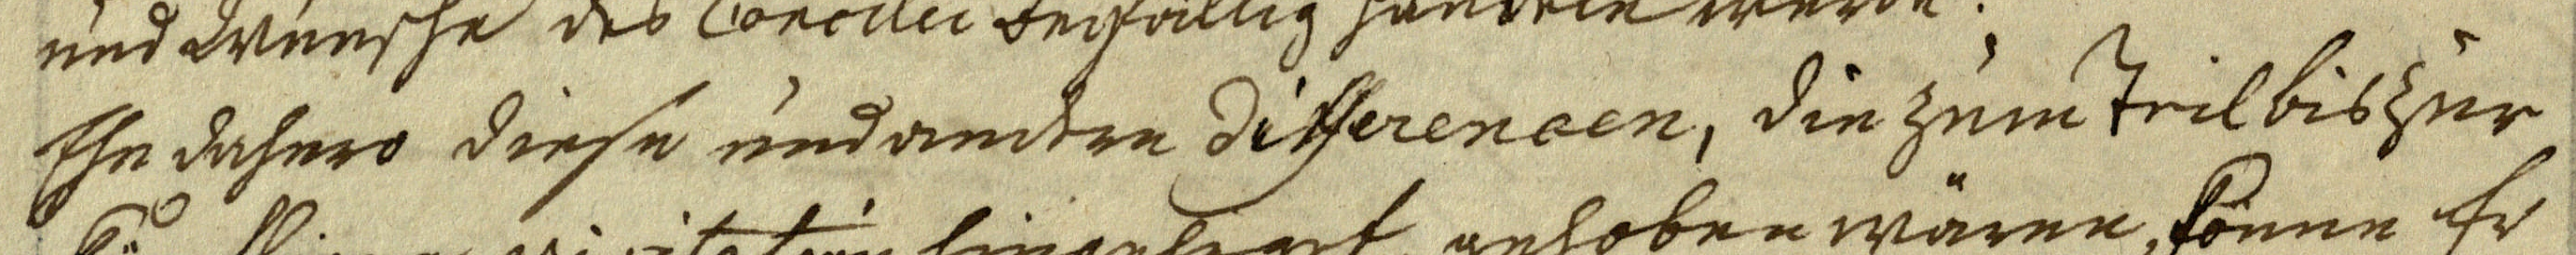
Ehe dahero diese und andere differencen, die zum Teil bis zur
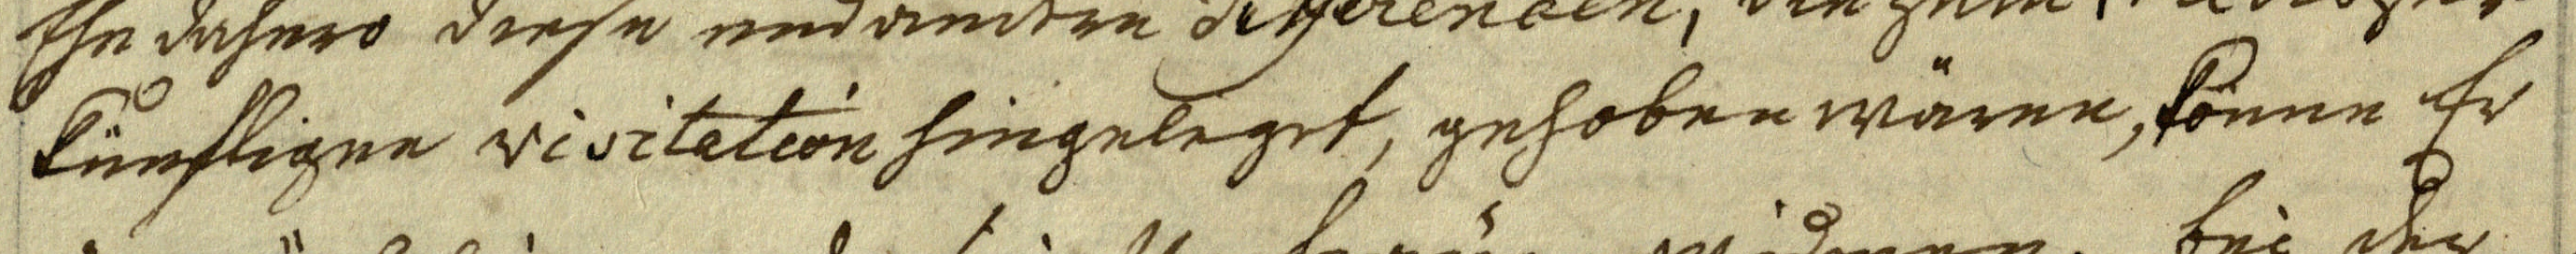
künftigen Visitation hingeleget, gehoben wären, könne Er
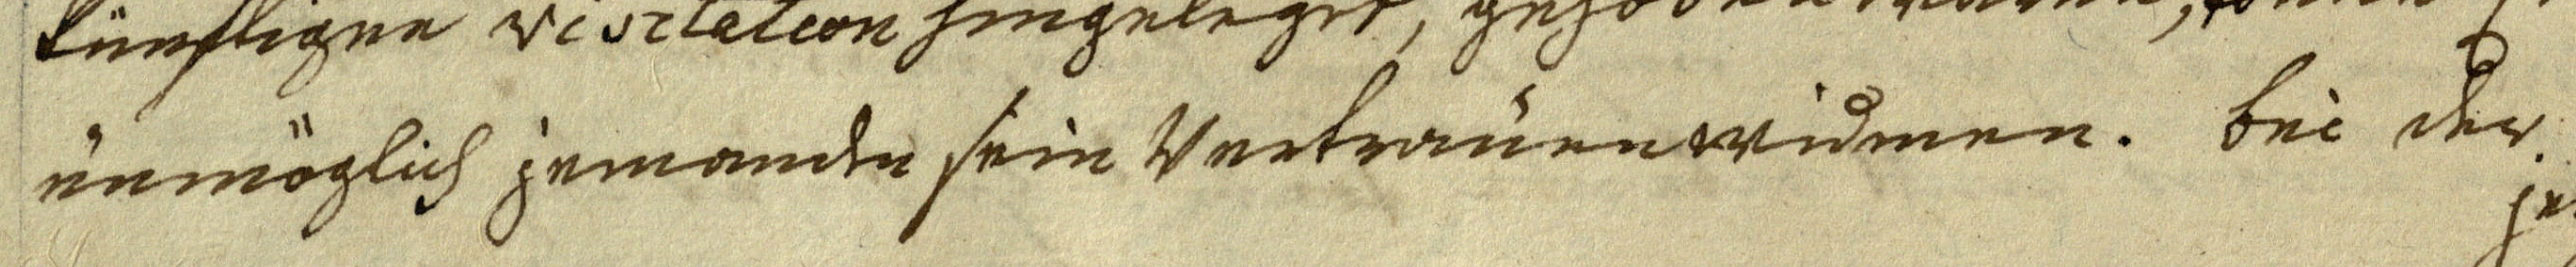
unmöglich jemanden sein Vertrauen widmen. Bei den
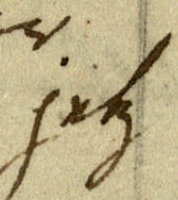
jetz
